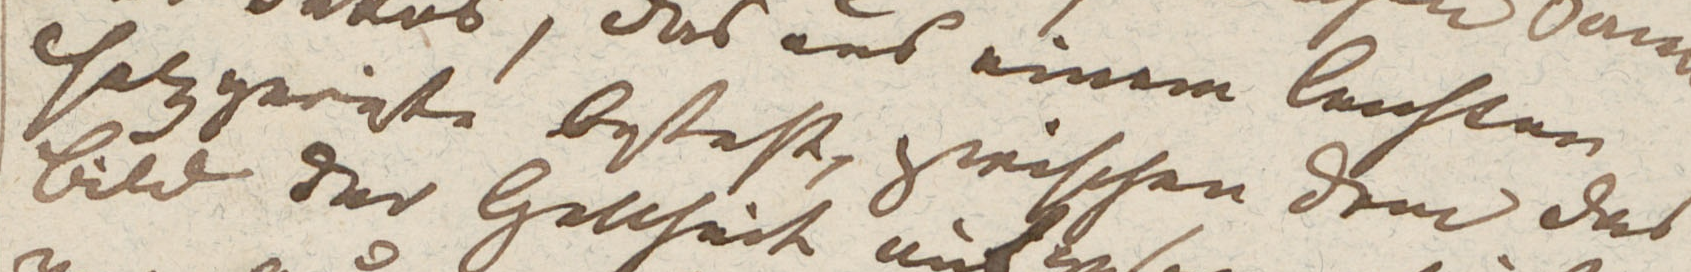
Holzgerüste besteht, zwischen dem das
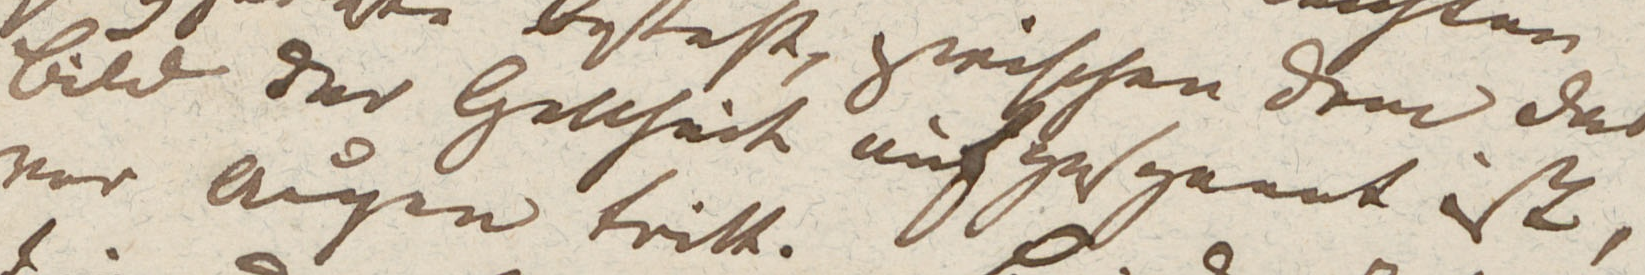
Bild der Gottheit aufgespannt ist,
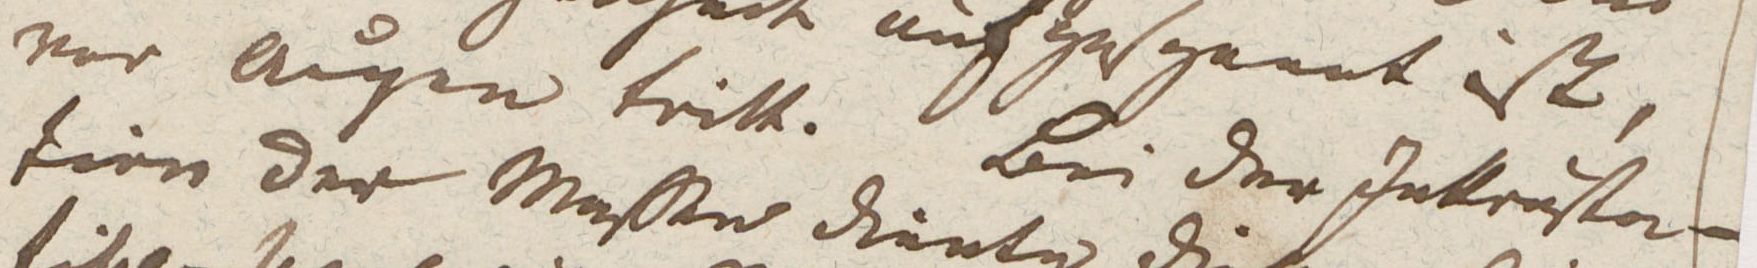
vor Augen tritt. Bei der Inkrusta-
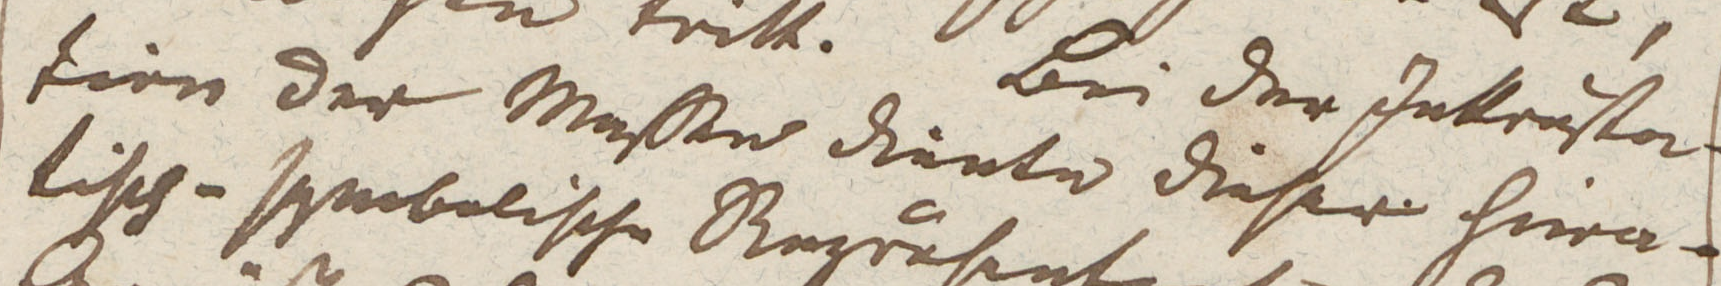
tion der Massen diente dieser hiera-
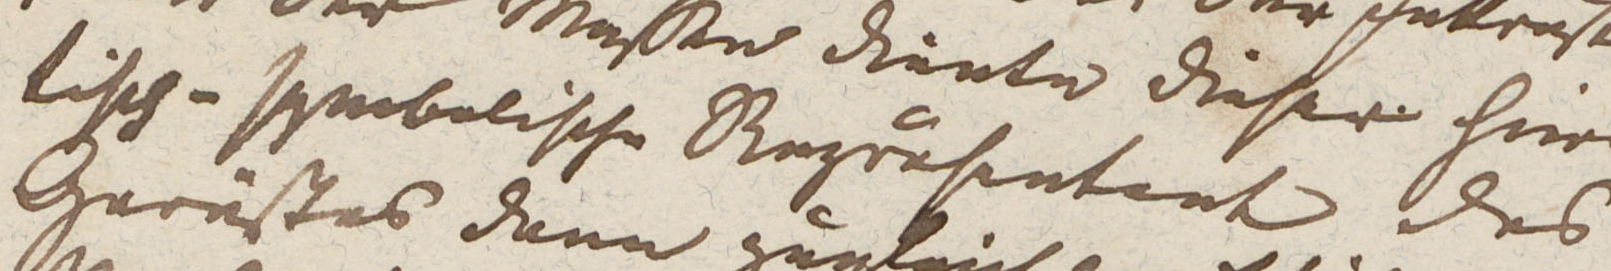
tisch-symbolische Repräsentant des
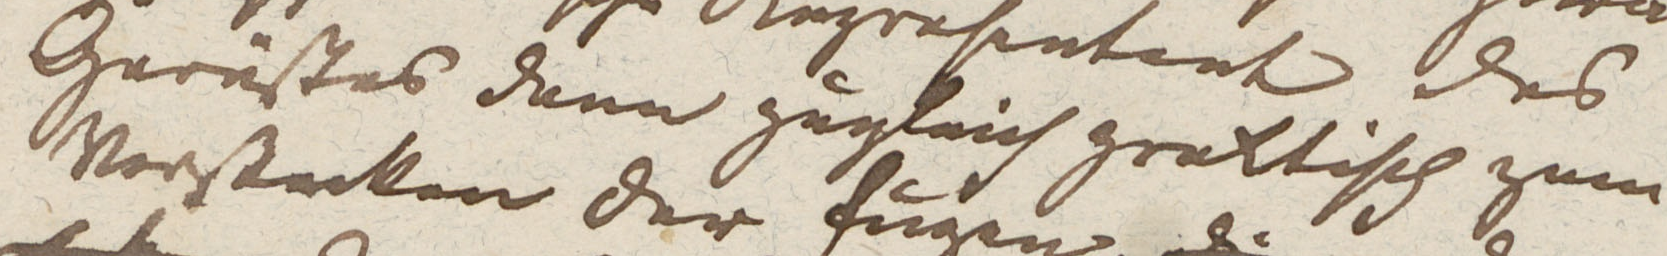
Gerüstes dann zugleich praktisch zum
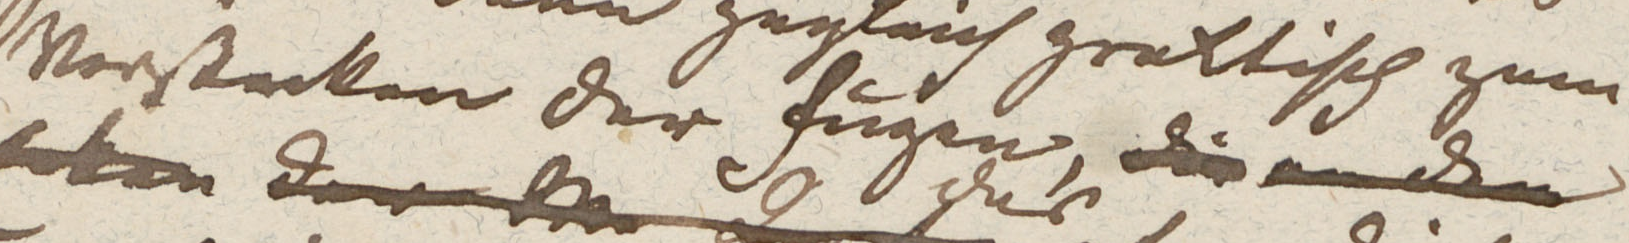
Verstecken der Fugen, die an den
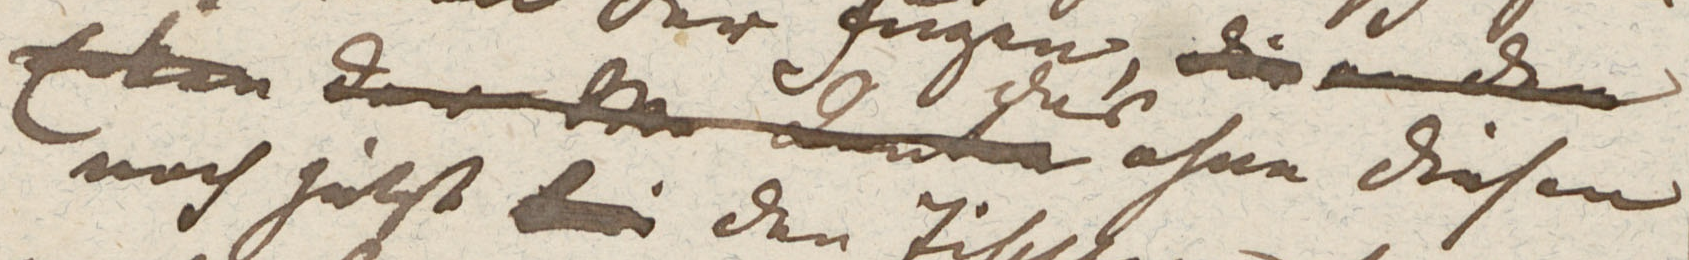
Ecken der M Kante das ohne diesen
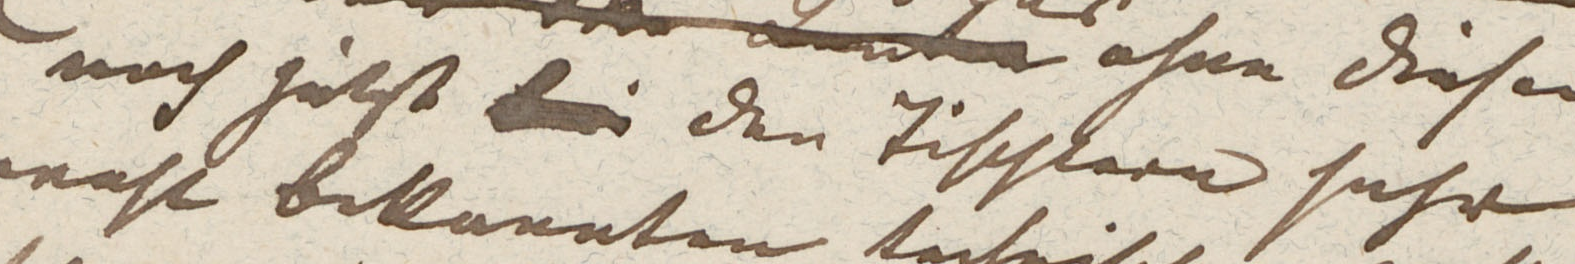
noch jetzt bei den Tischlern sehr
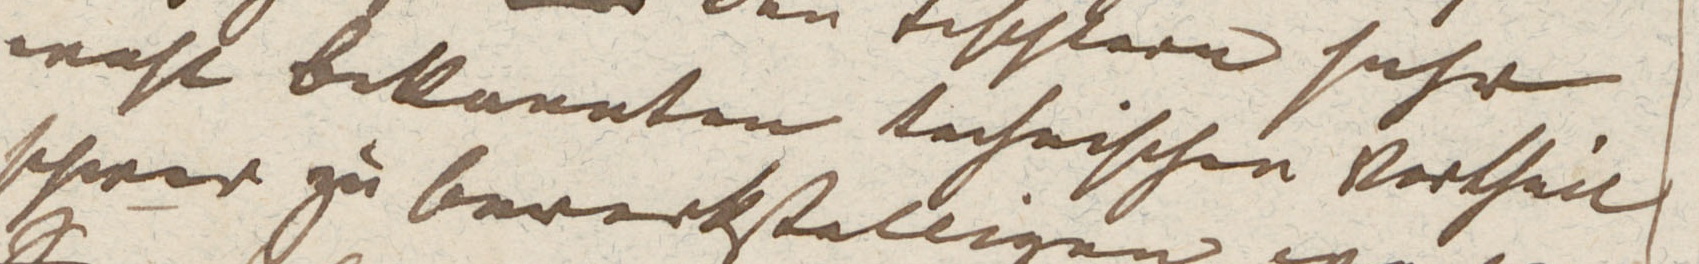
wohl bekannten technischen Vortheil
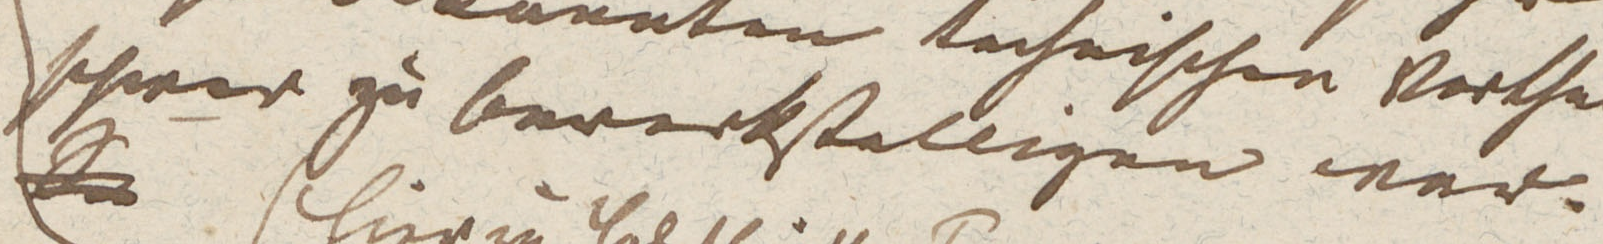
schwer zu bewerkstelligen war.
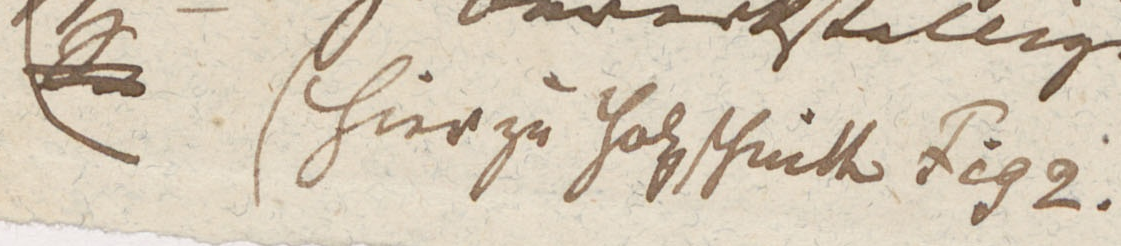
S (Hierzu Holzschnitt Fig 2.
